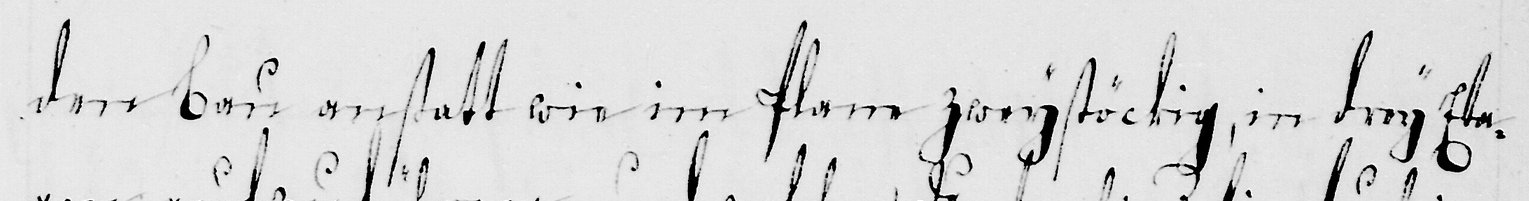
den Bau anstatt wie im Plane zweystöckig, in drey Eta¬
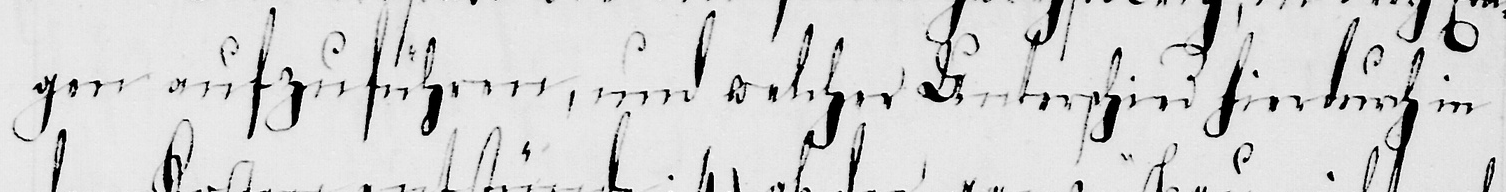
gen aufzuführen, und welcher Unterschied hierdurch in
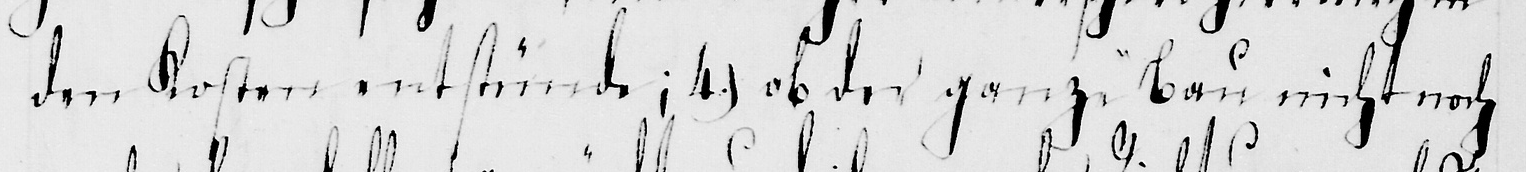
den Kosten entstünde; 4.) ob der ganze Bau nicht noch
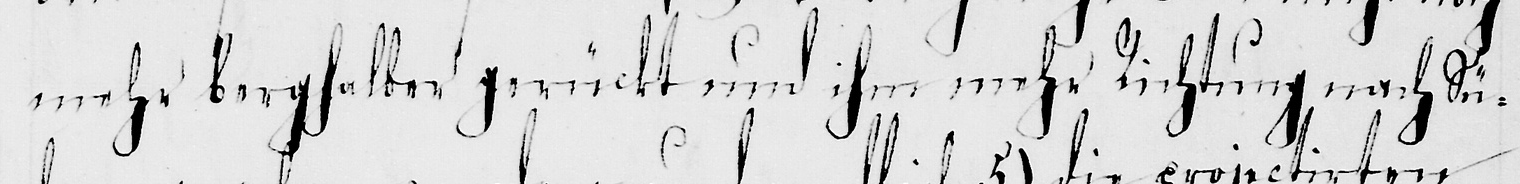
mehr berghalber gerückt und ihm mehr Richtung nach Sü¬
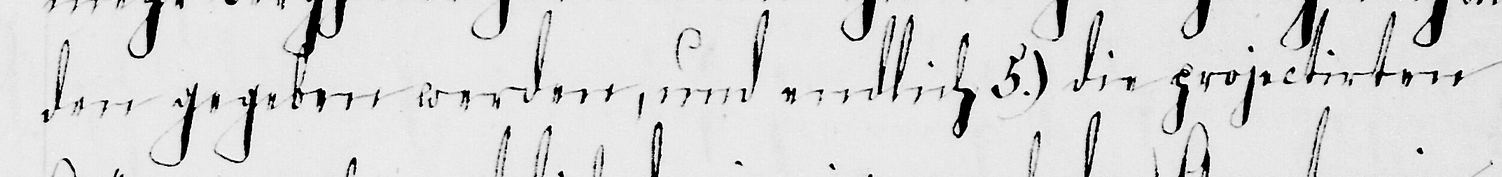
den gegeben werden, und endlich 5.) die projectirten
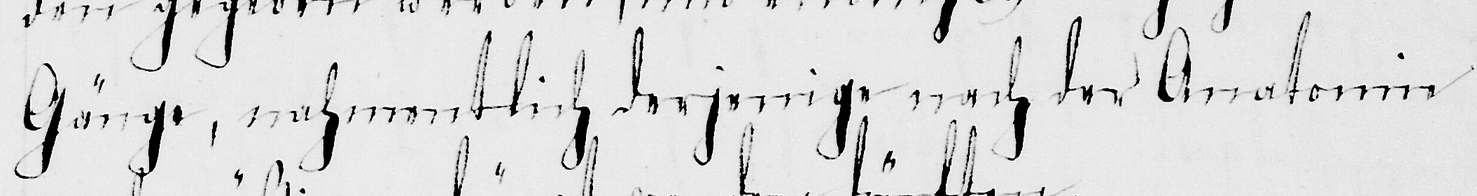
Gänge, nahmentlich derjenige nach der Anatomie
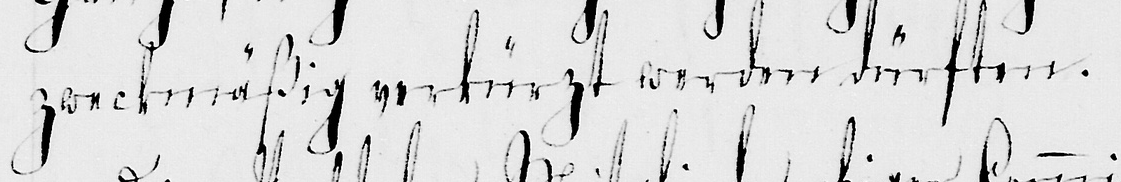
zweckmäßig verkürzt werden dürften.
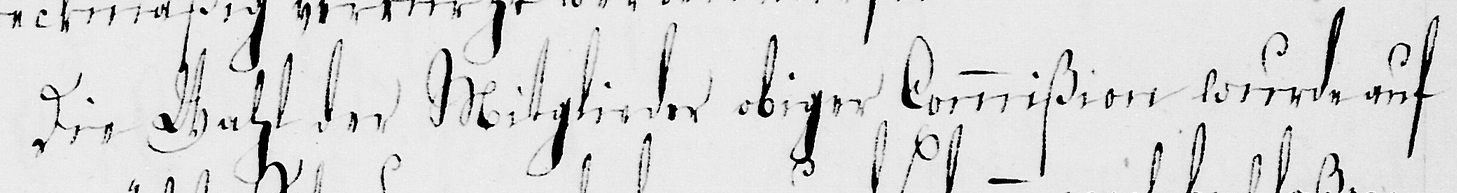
Die Wahl der Mitglieder obiger Commißion wurde auf
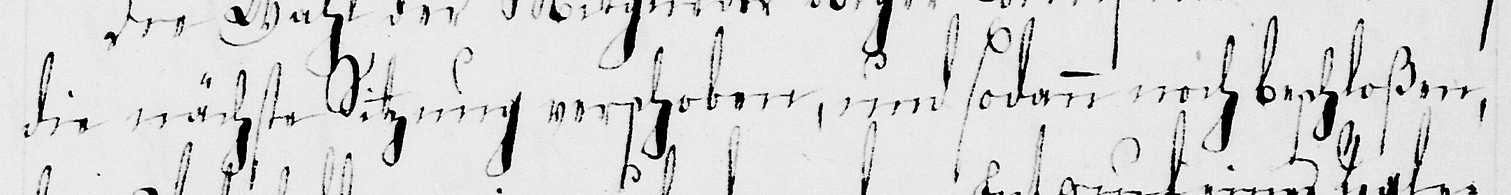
die nächste Sitzung verschoben, und sodann noch beschloßen,
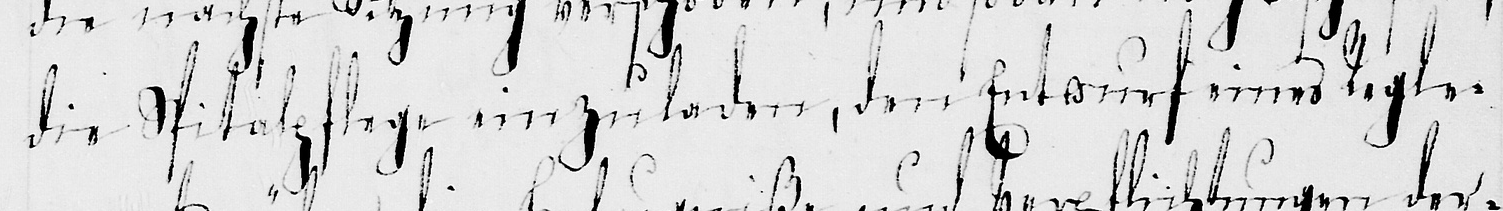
die Spitalpflege einzuladen, den Entwurf eines Regle¬
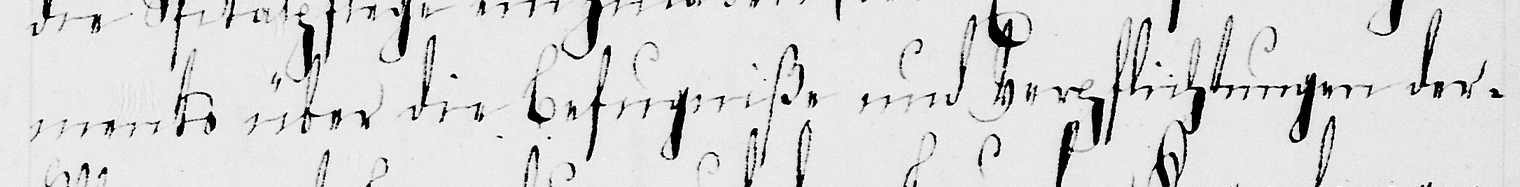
ments über die Befugniße und Verpflichtungen der¬
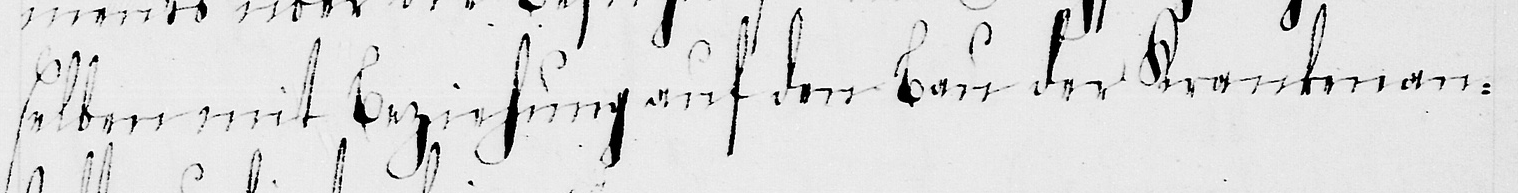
selben mit Beziehung auf den Bau der Krankenan¬
